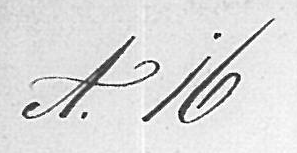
A. 16
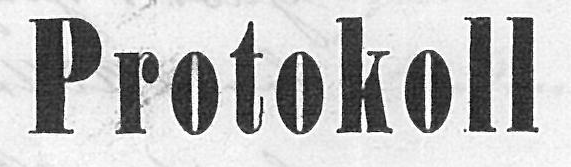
Protokoll
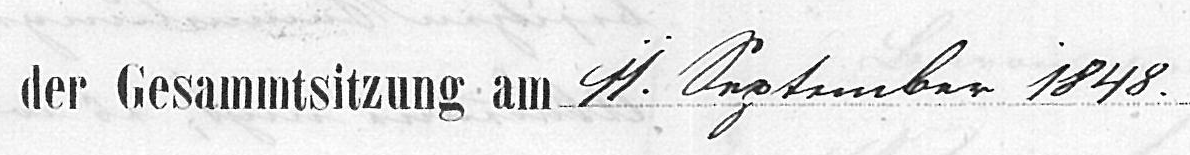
der Gesammtsitzung am 11. September 1848
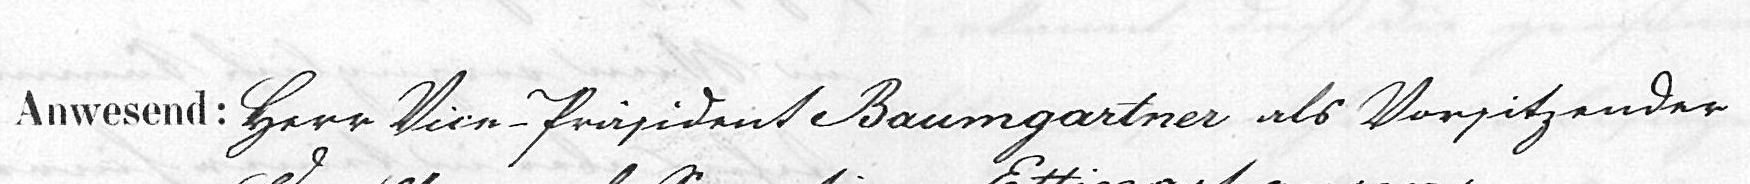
Anwesend: Herr Vice-Präsident Baumgartner als Vorsitzender
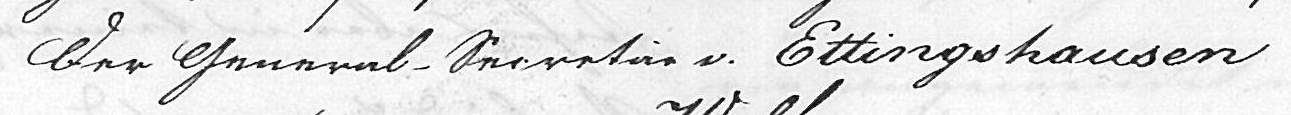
Der General-Secretär v. Ettingshausen
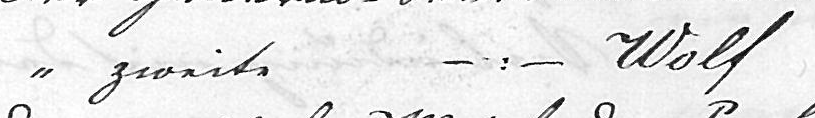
" zweite " Wolf
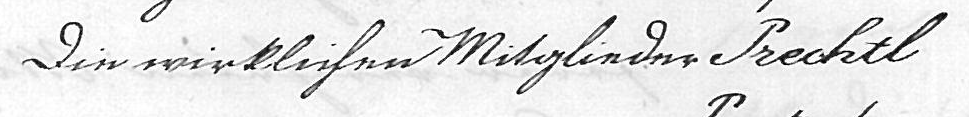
die wirklichen Mitglieder Prechtl
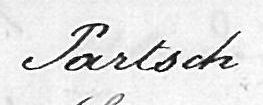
Partsch
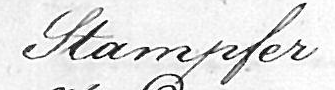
Stampfer
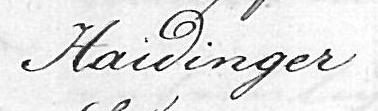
Haidinger
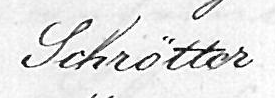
Schrötter
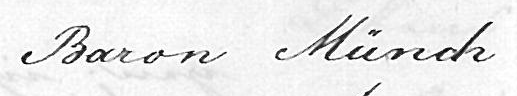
Baron Münch
